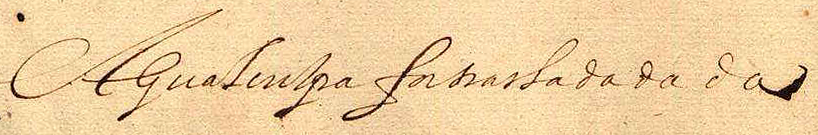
A qual culpa foi trasladada da
